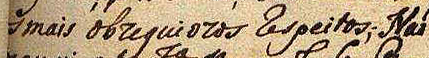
s mais obzequiozos Respeitos; Naõ
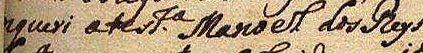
nqueri a test.a Manoel dos Reys
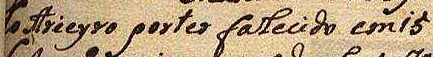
do Arieyro por ter falecido em i5
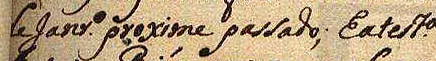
de Janr.o proxime passado; E a test.a
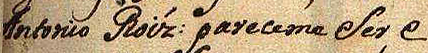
Antonio Roiz̄: pareceme Ser e
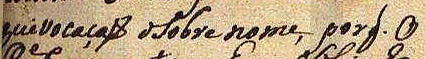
quivocaçaõ o sobrenome, porq̄. o
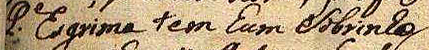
P.e Esgrima tem hum Sobrinho
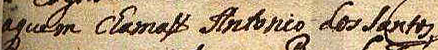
a quem chamaõ Antonio dos Santos
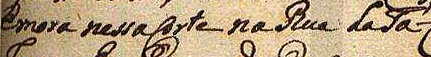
E mora nessa Corte na Rua daTa
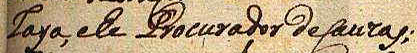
Laya, e he Procurador de Cauzas;
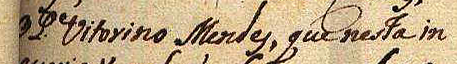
o P.e Vitorino Mendes, que nesta in
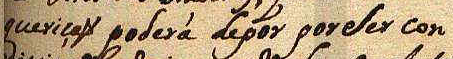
queriçaõ poderá depor por Ser con
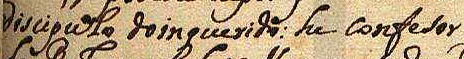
discipulo do inquerido: he confesor
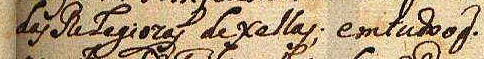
das Relegiozas de xellas; em tudo o q̄.
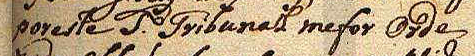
por este S.to Tribunal me for orde
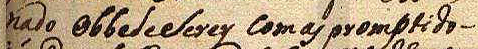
nado obbedeSerey com as promptido
